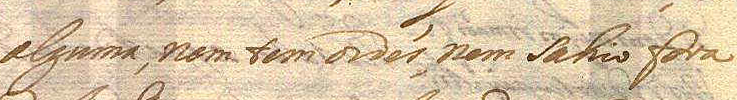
alguma, nem tem ordēs, nem sahio fora
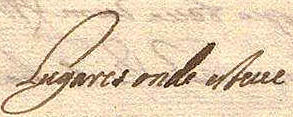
Lugares onde esteue
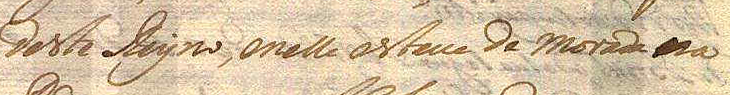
deste Reyno, e nelle esteue de morada na
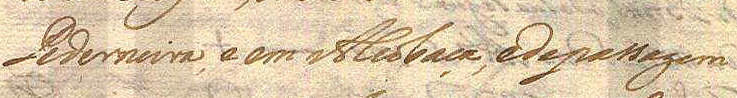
Pederneira, e em Alcobaça, e de passagem
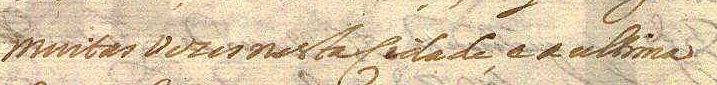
muitas vezes nesta Cidade, e a ultima
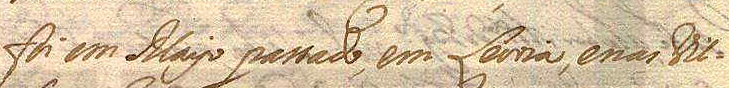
foi em Mayo passado, em Leiria, e nas Vil
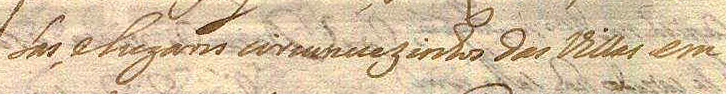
las, e lugares circunuezinhos das Villas em
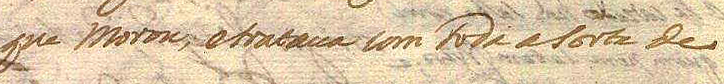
que morou, e trataua com toda a sorte de
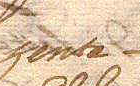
gente
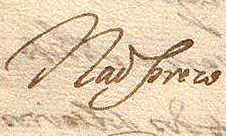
Naõ prezo
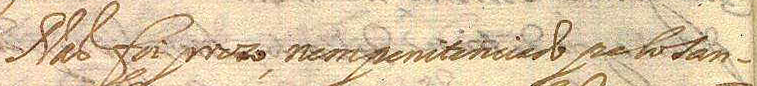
Naõ foi prezo, nem penitenciado pelo san
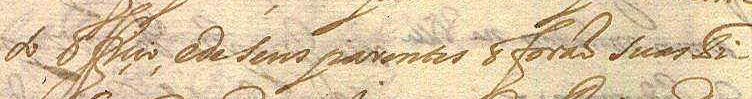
to officio, e de seus parentes e foraõ suas Ti
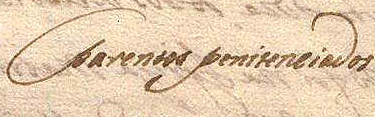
Parentes penitenciados
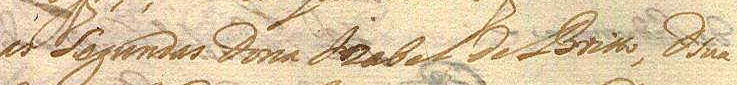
as segundas Dona Izabel de Britto, & sua
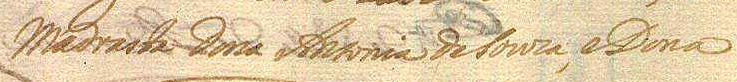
madrasta Dona Antonia de souza, e Dona
